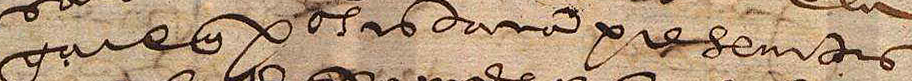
gar e q̄ pas estauā presemtes
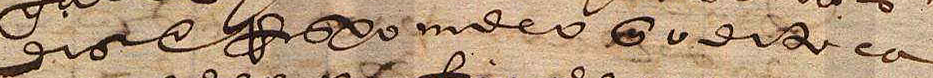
dise e Respomdeo q̄ o dito ca
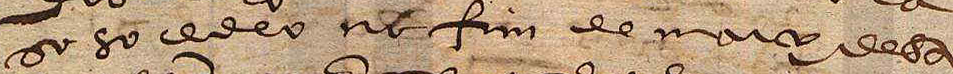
so socedeo no fim de março deste
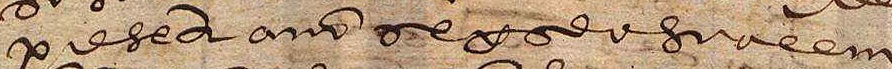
presēte anō segdo sua lem
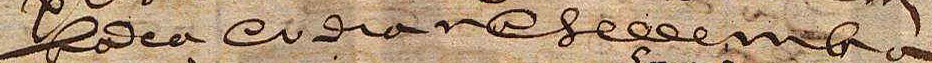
brāça e o dia nā se llembra
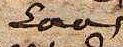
horas
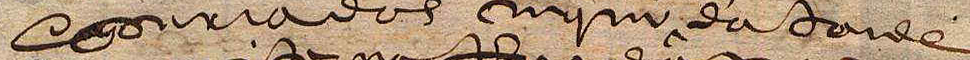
e q̄ seria das cinquo da tarde
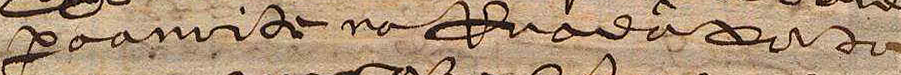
ꝑa a noite na Rua da porta
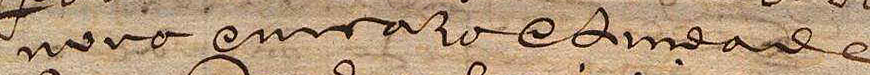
noua e em caza e temda de
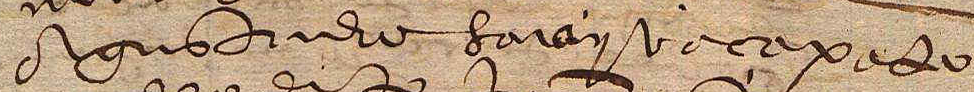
Agustinho sarayva çapato
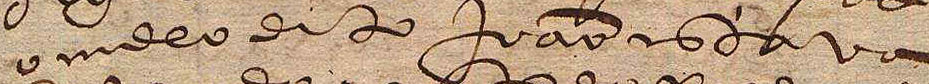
omde o dito João estava
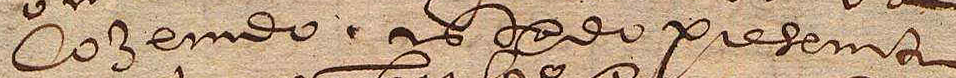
Cozemdo estādo presemte
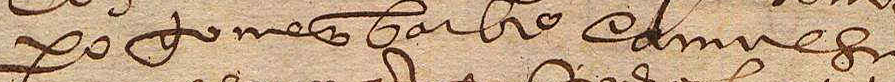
po gomez barbro e a mulher
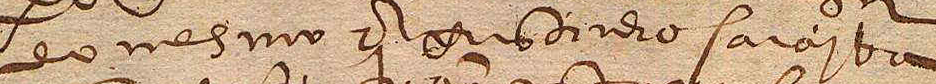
do mesmo Agustinho sarajua
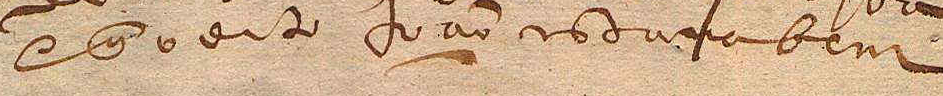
e q̄ o dito João estaua bem
